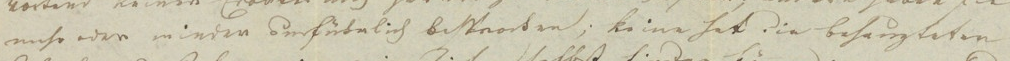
mehr oder minder ausführlich besprochen; keine hat die behaupteten
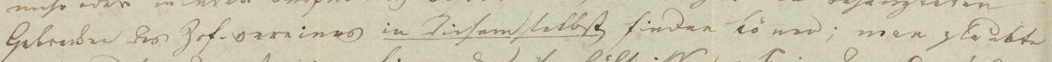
Gebrechen des Zof.vereines in diesem selbst finden können; man glaubte
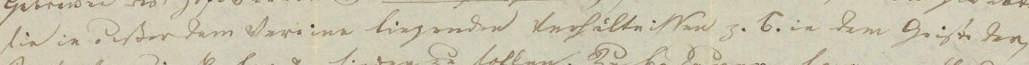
sie in außer dem Vereine liegenden Verhältnissen z. B. in dem Geiste der
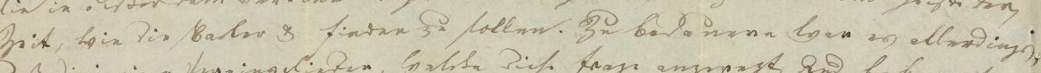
Zeit, wie die Basler & finden zu sollen. Zu bedauern war es allerdings,
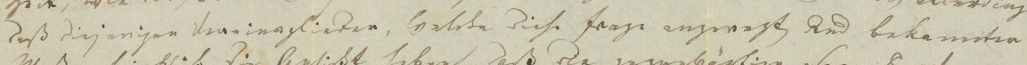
daß diejenigen Vereinsglieder, welche diese Frage angeregt, und bekannter
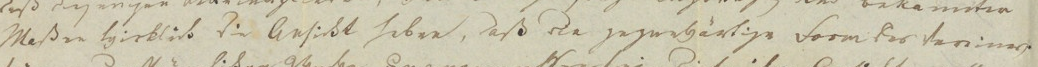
Maßen wirklich die Ansicht haben, daß die gegenwärtige Form des Vereines
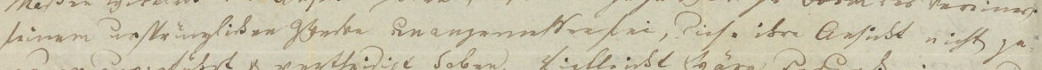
seinem ursprünglichen Zwecke unangemessen sei, diese ihre Ansicht nicht ge-
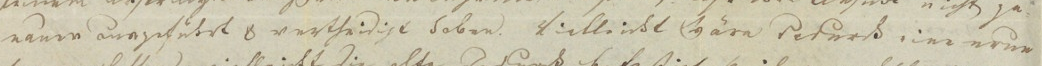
nauer ausgeführt & vertheidigt haben. Vielleicht wäre dadurch eine neue
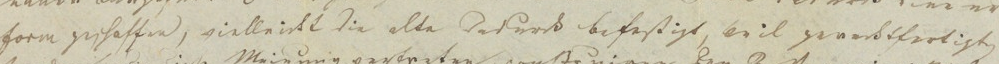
Form geschaffen, vielleicht die alte dadurch befestigt, weil gerechtfertigt,
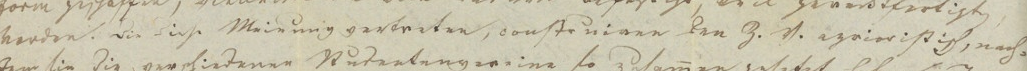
worden. Die diese Meinung vertreten, construiren den Z.V. aprioristisch, nach-
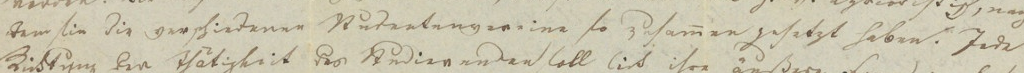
dem sie die verschiedenen Studentenvereine so zusammen gesetzt haben. Jede
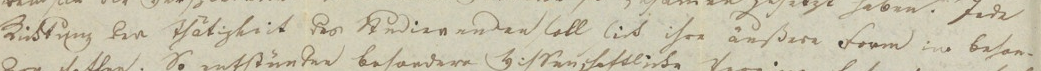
Richtung der Thätigkeit des Studierenden soll sich ihre äußere Form im beson-
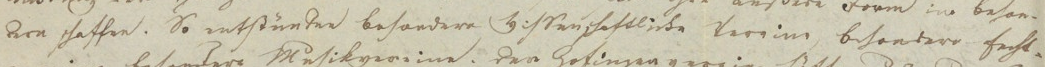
dern schaffen. So entstünden besondere wissenschaftliche Vereine, besondere Fecht-
